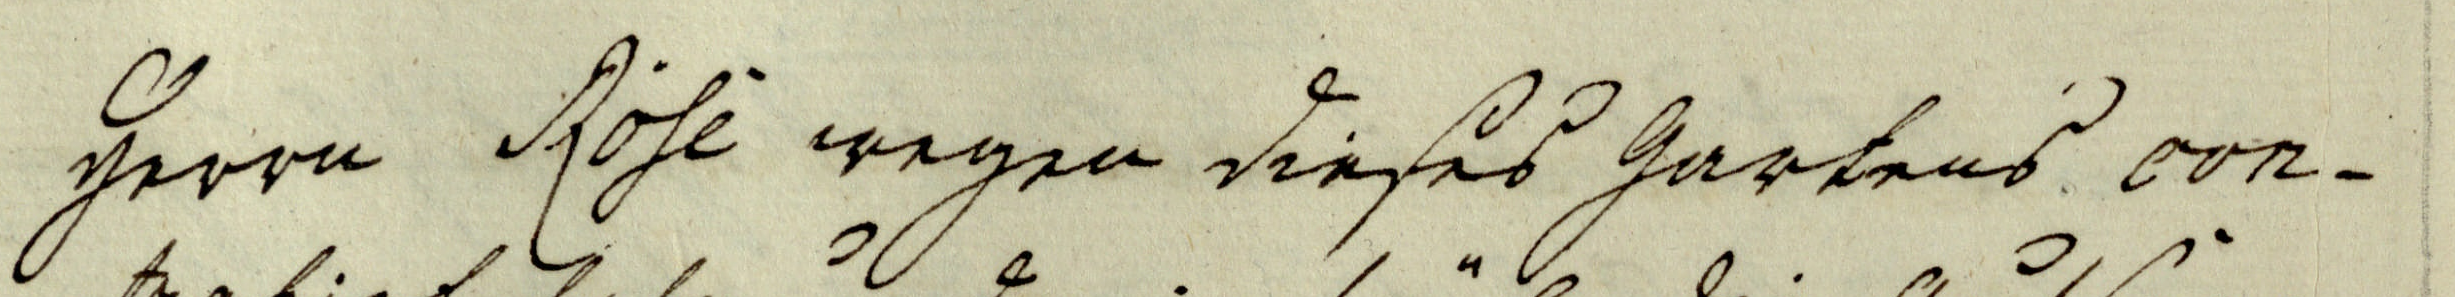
Herrn Röse wegen dieses Gartens con¬
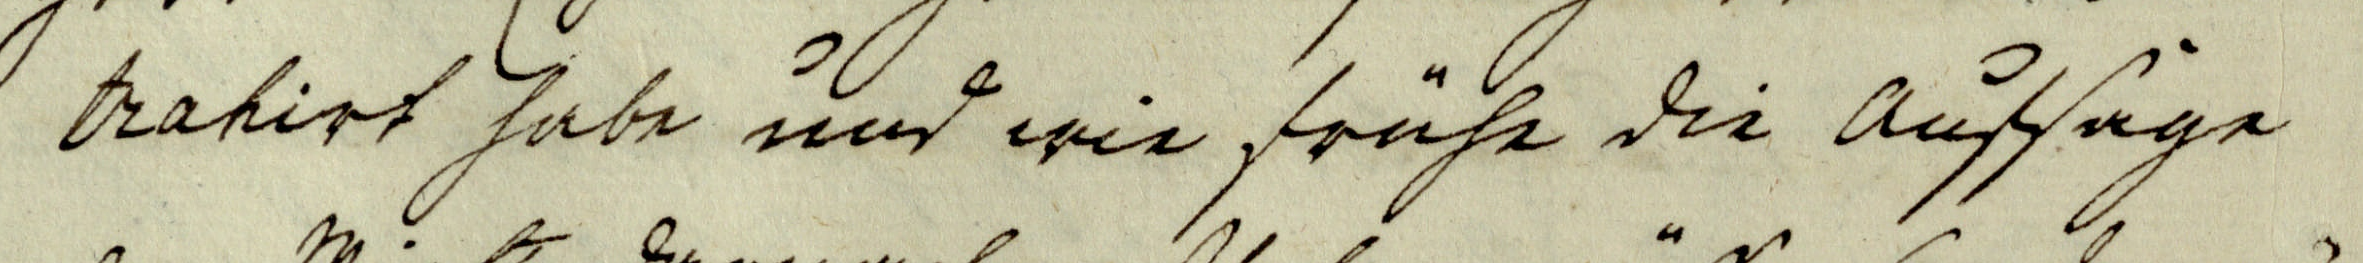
trahirt habe und wie frühe die Aufsage
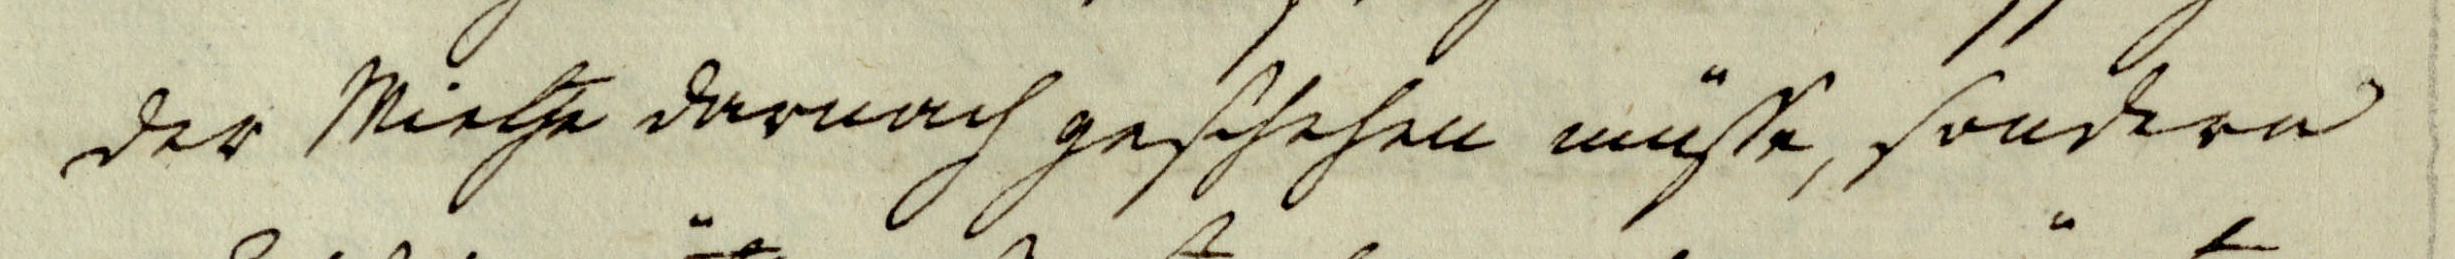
der Miethe darnach geschehen müsse, sondern
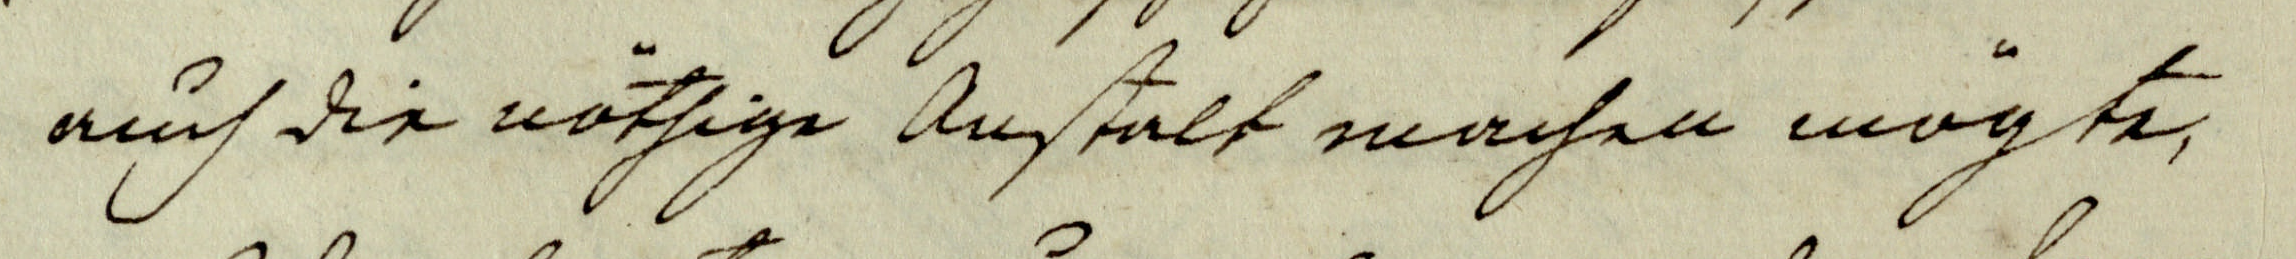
auch die nöthige Anstalt machen mögte,
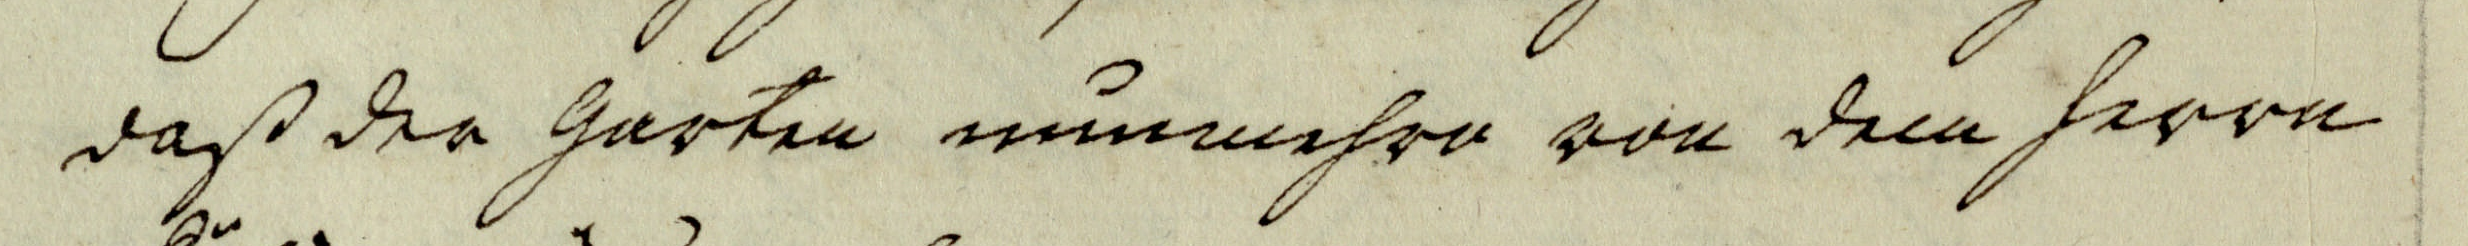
daß der Garten nunmehro von dem Herrn
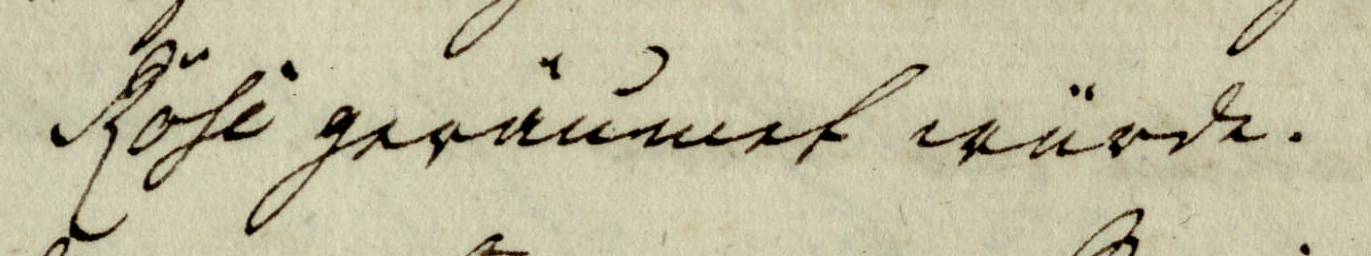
Röse geräumet würde.
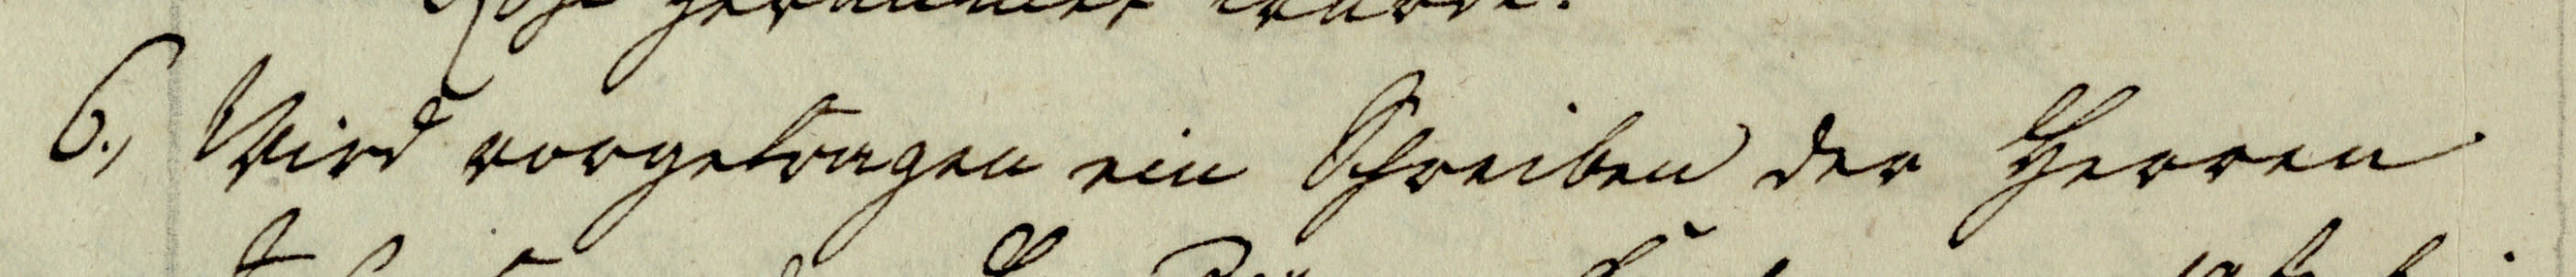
6., Wird vorgetragen ein Schreiben der Herren
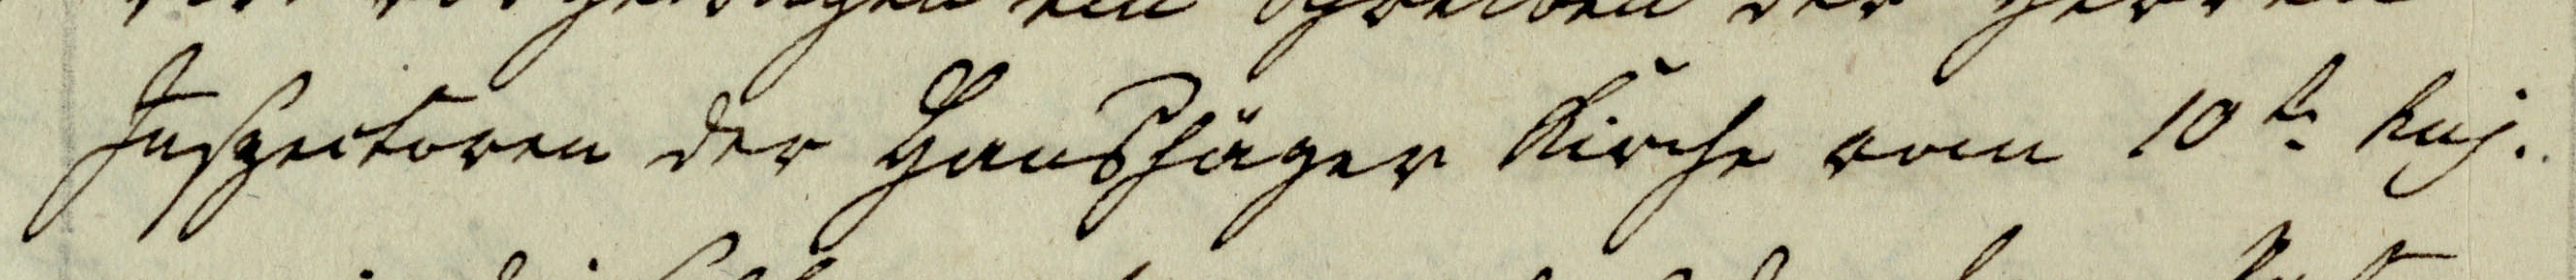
Inspectoren der Hanshäger Kirche vom 10 t huj.
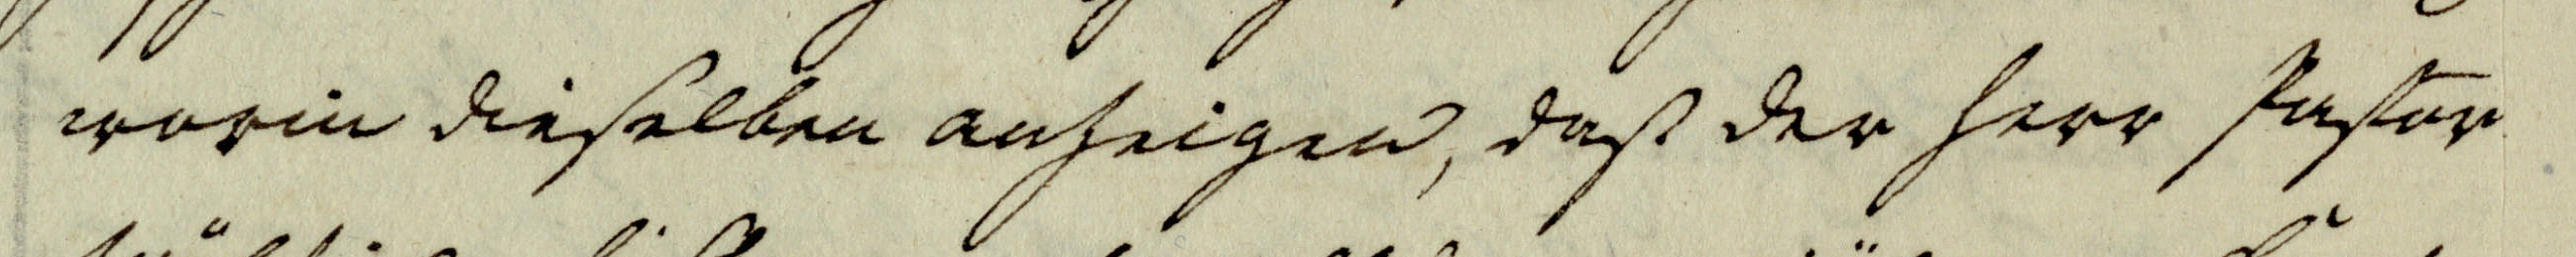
worin dieselben anzeigen, daß der Herr Pastor
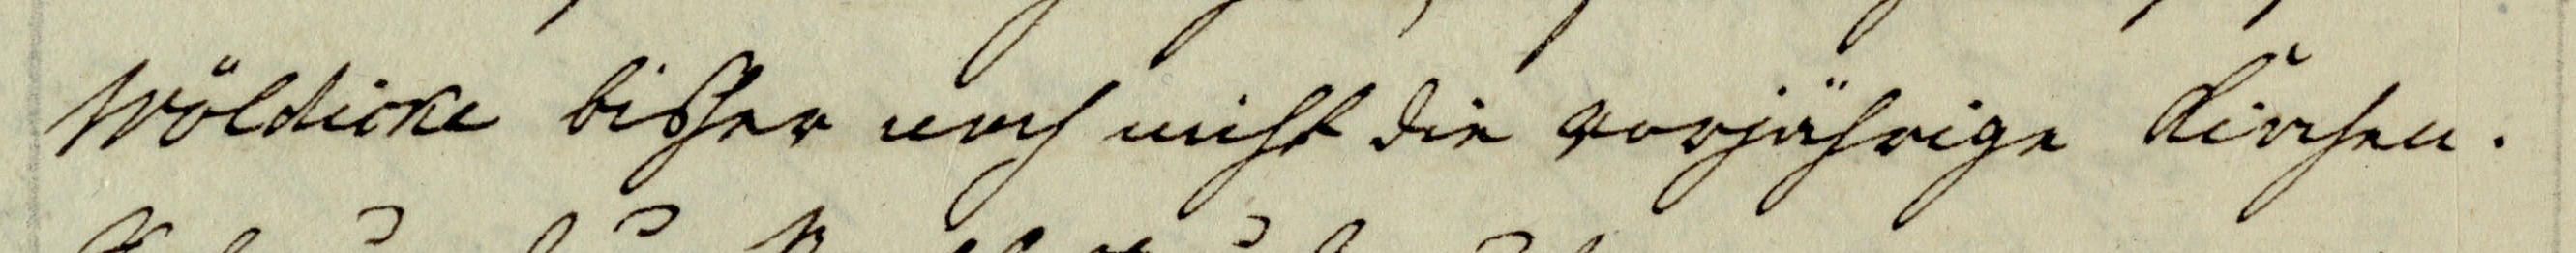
Wöldicke bisher noch nicht die vorjährige Kirchen¬
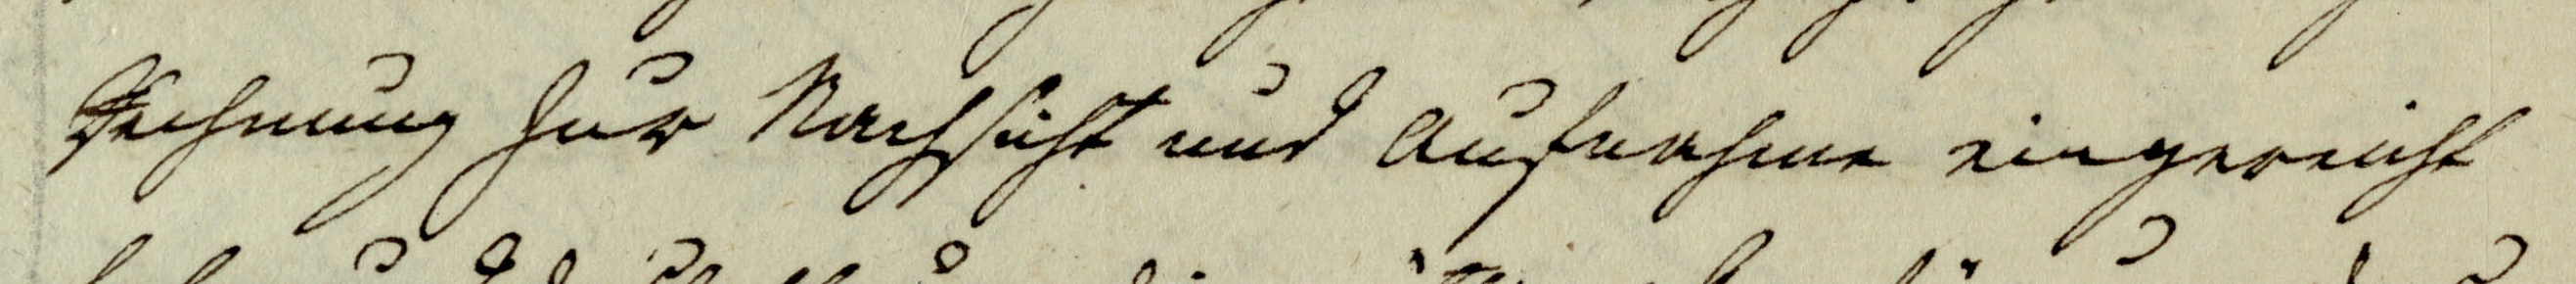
Rechnung zur Nachsicht und Aufnahme eingereicht
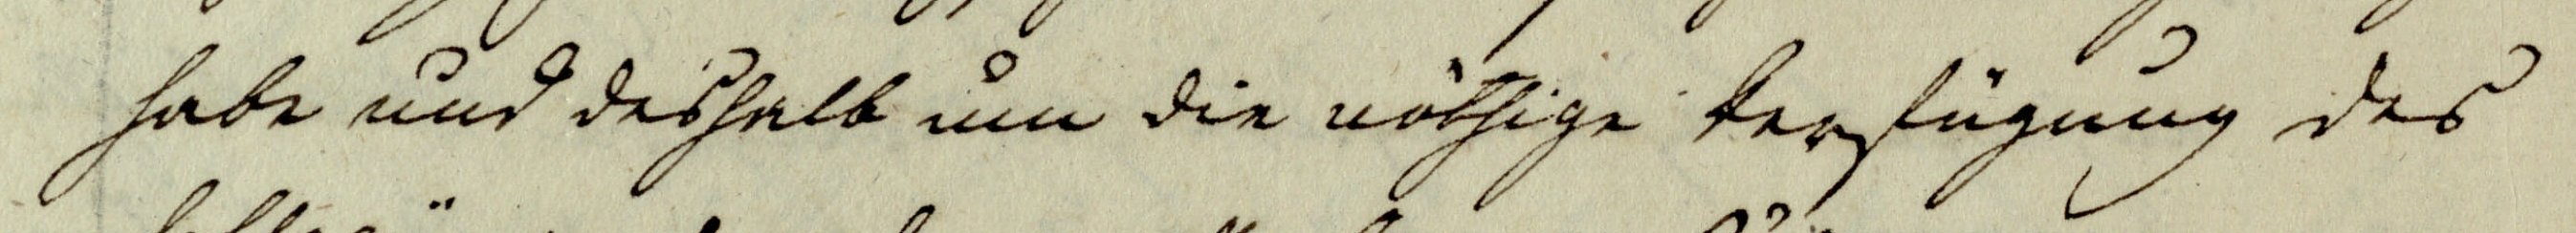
habe und deshalb um die nöthige Verfügung des
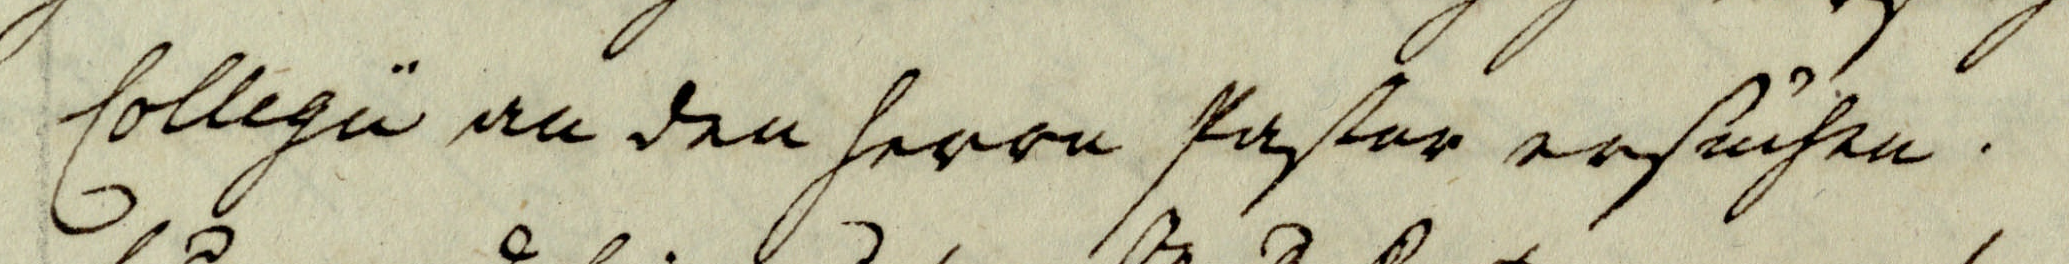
Collegii an den Herrn Pastor ersuchen.
